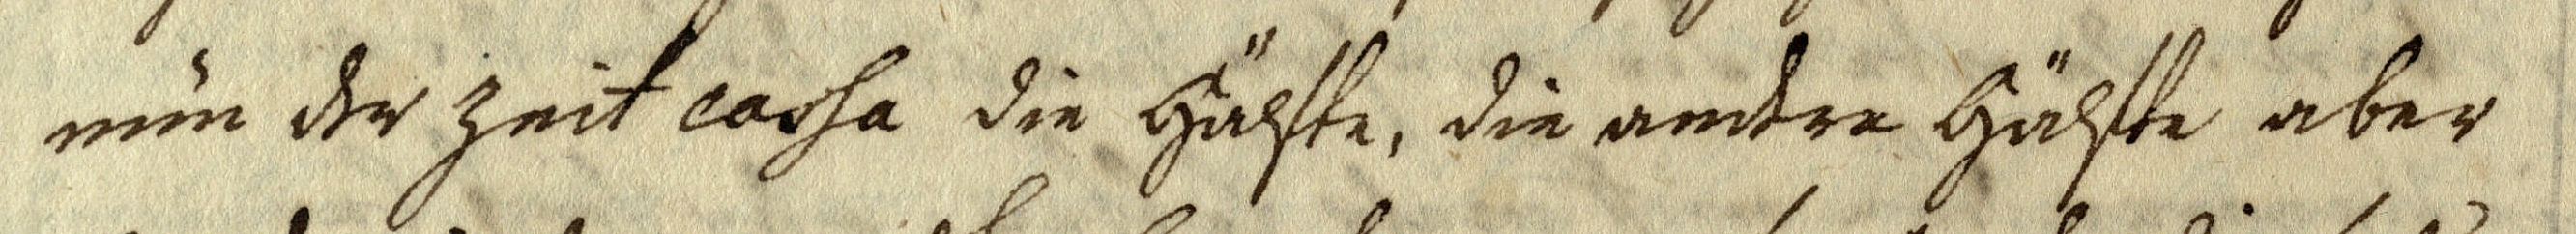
nun der Zeit cassa die Hälfte, die andere Hälfte aber
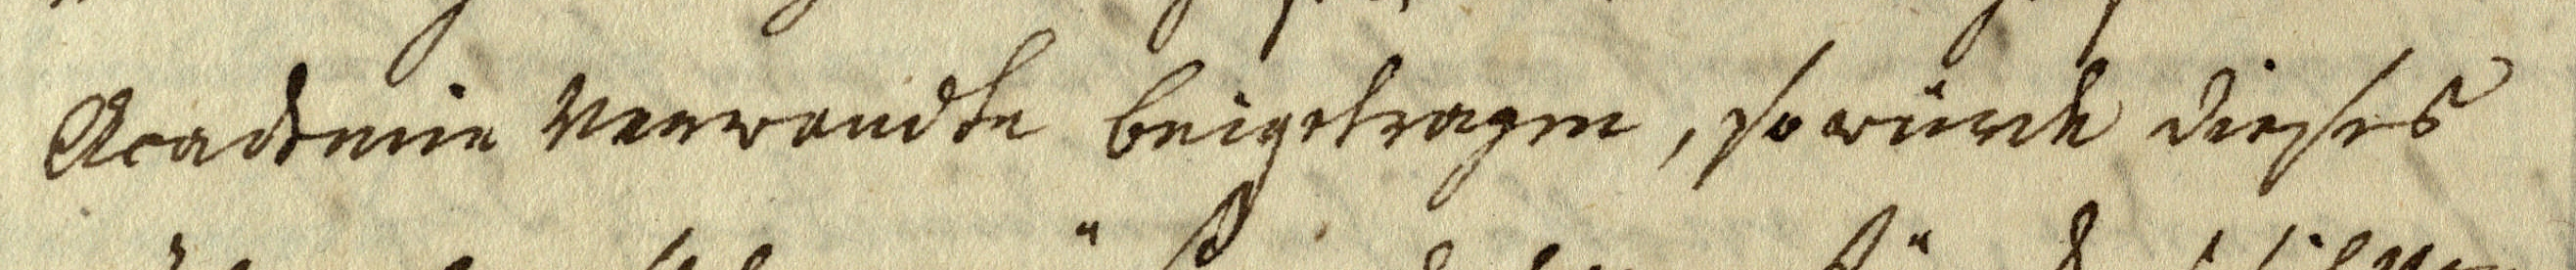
Academie Verwandte beigetragen, so würde dieses
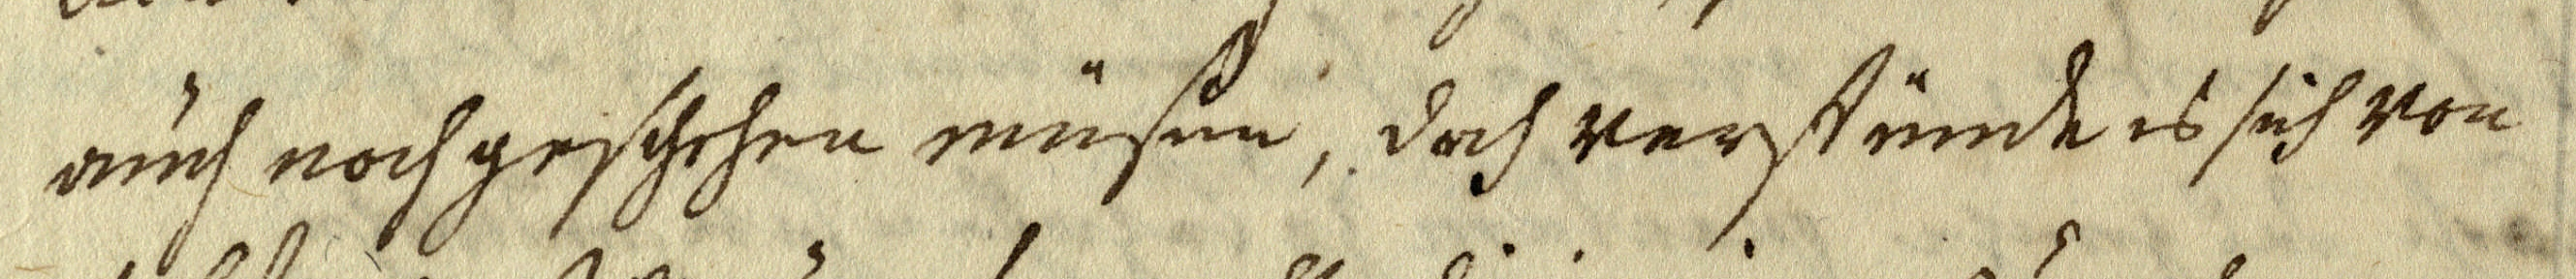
auch noch geschehen müßen, doch verstünde es sich von
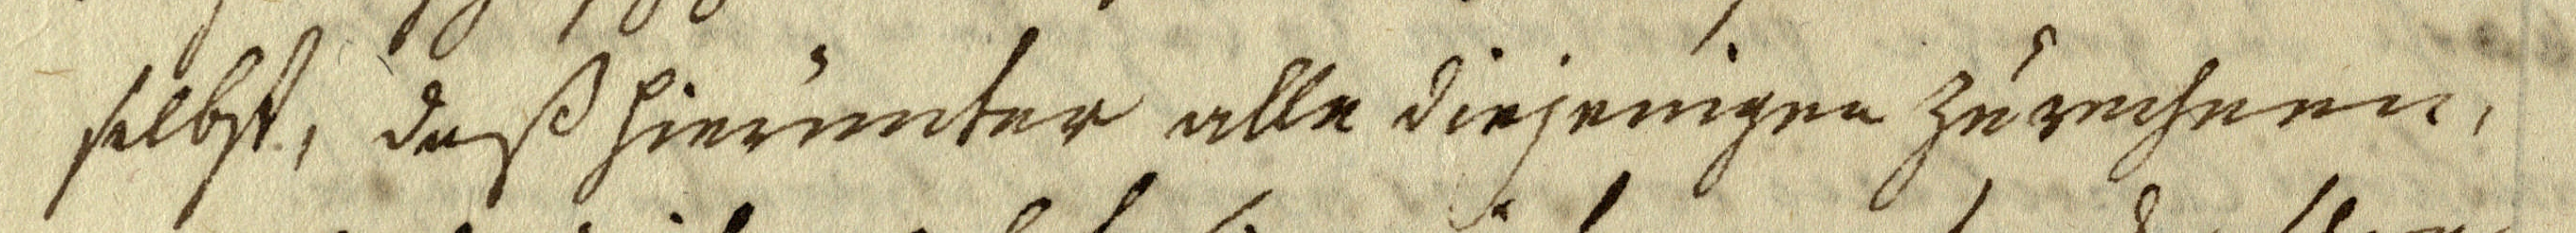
selbst, daß hierunter alle diejenigen zu rechnen,
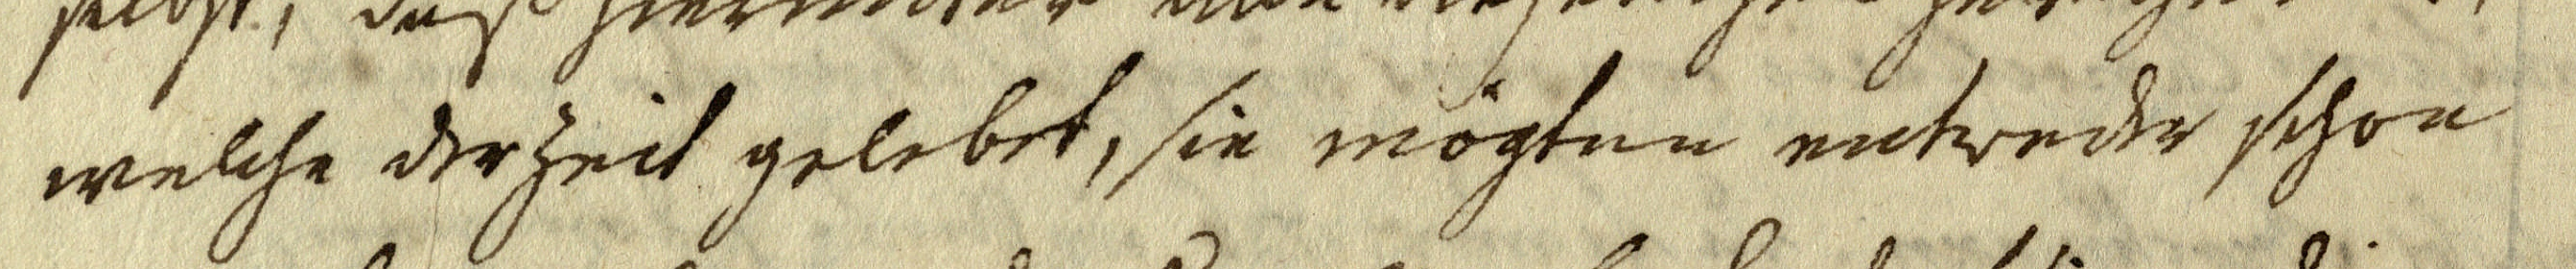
welche der Zeit gelebet, sie mögten entweder schon
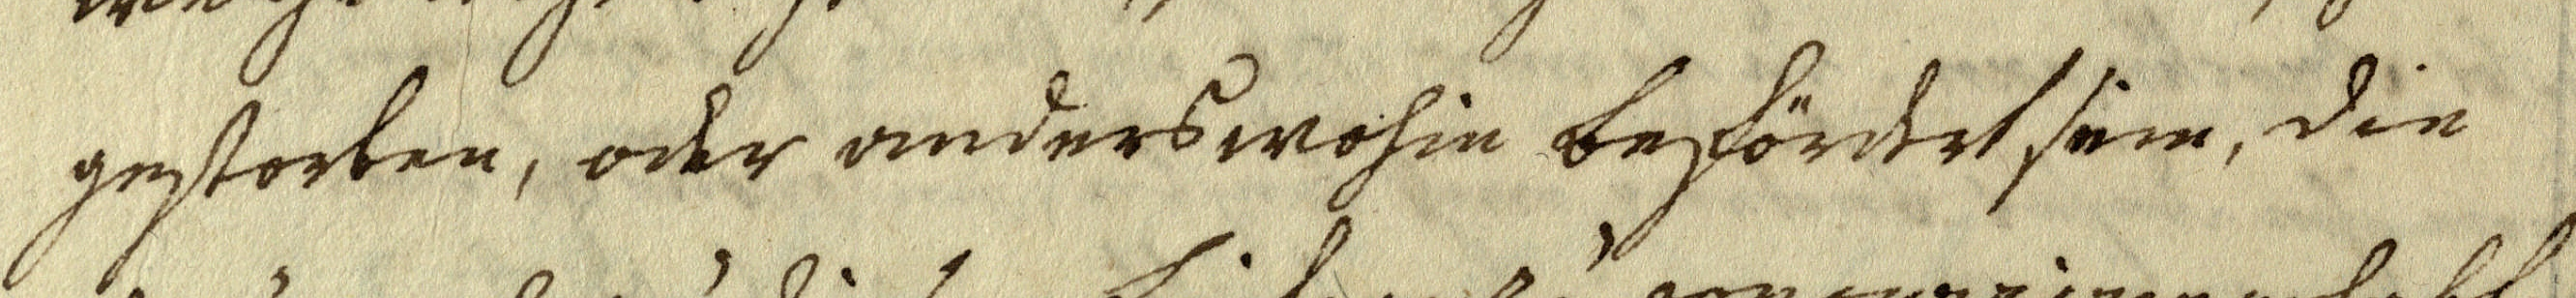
gestorben, oder anders wohin befördert sein, die
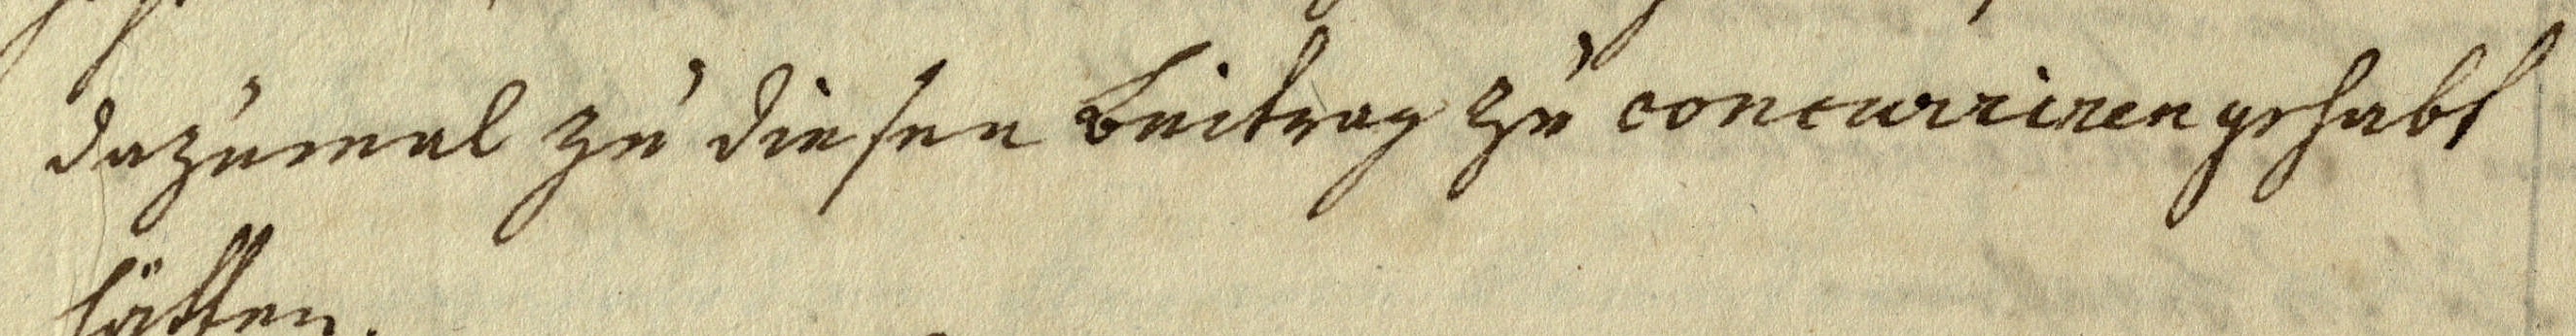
dazumal zu diesen Beitrag zu concurriren gehabt
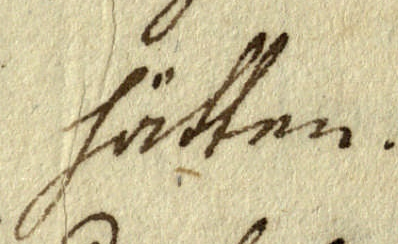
hätten.
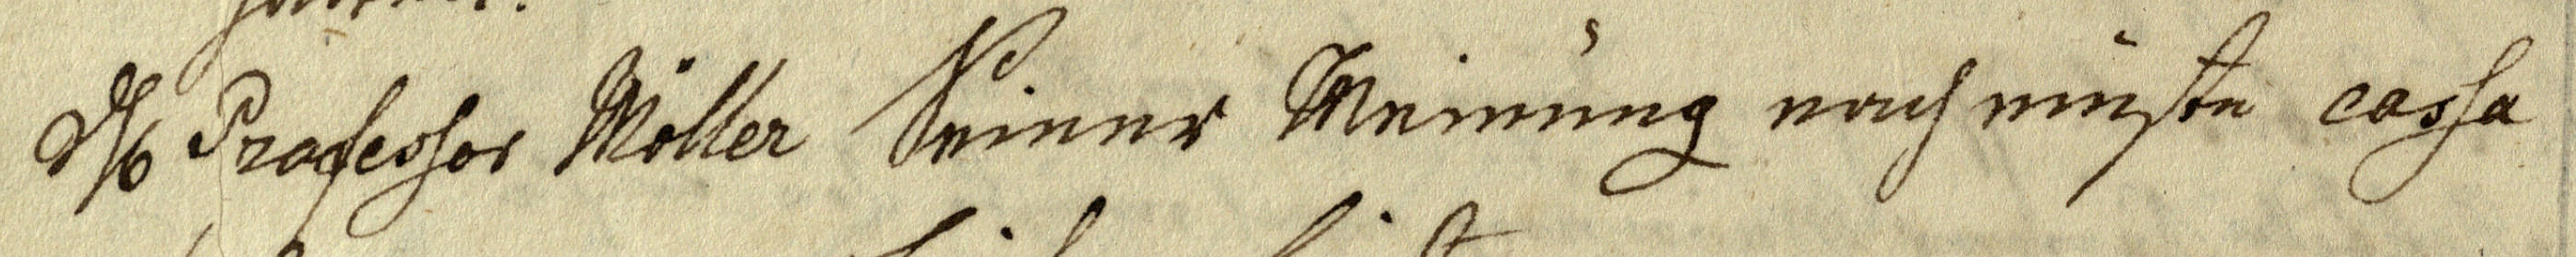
dh Professor Möller Seiner Meinung nach müste cassa
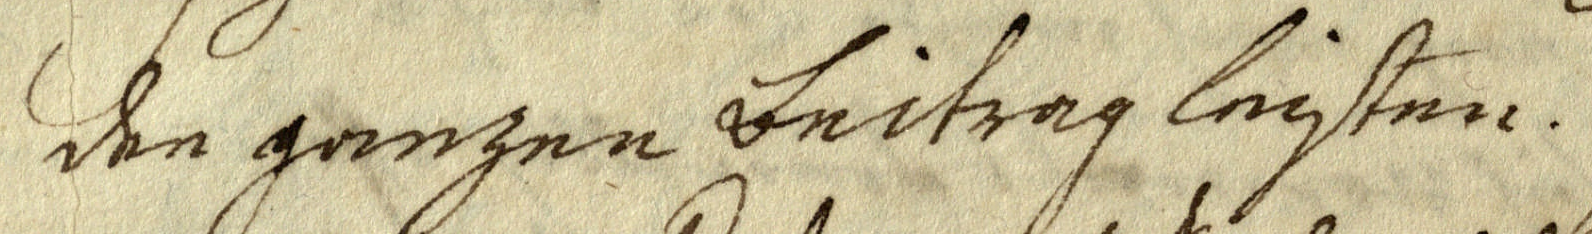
den ganzen Beitrag leisten.
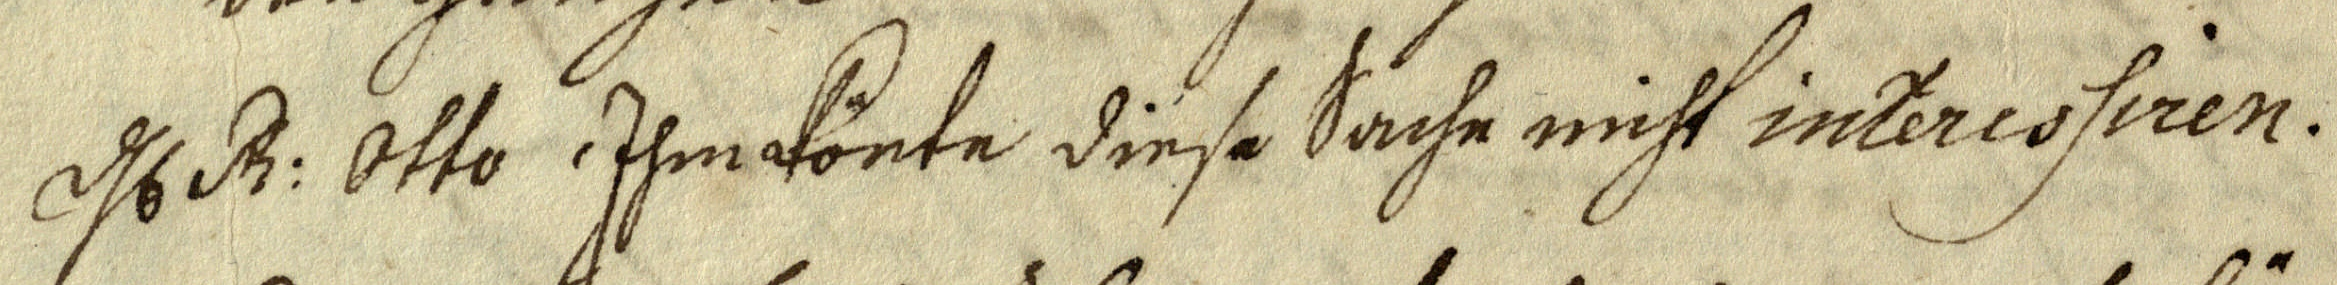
dh Pr: Otto. Ihm könte diese Sache nicht interessiren.
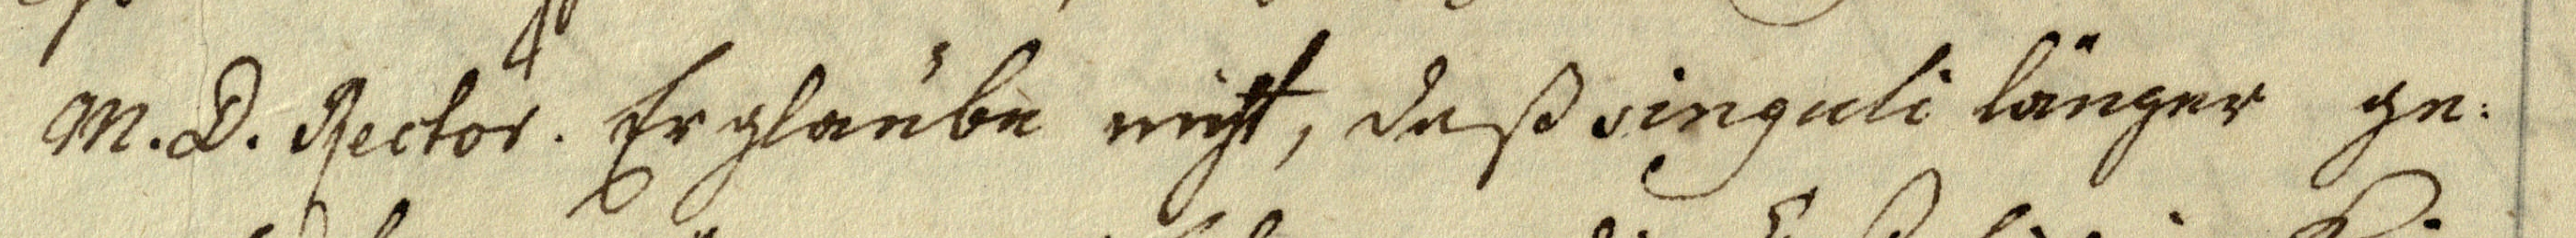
M. D. Rector. Er glaube nicht, daß singuli länger ge¬
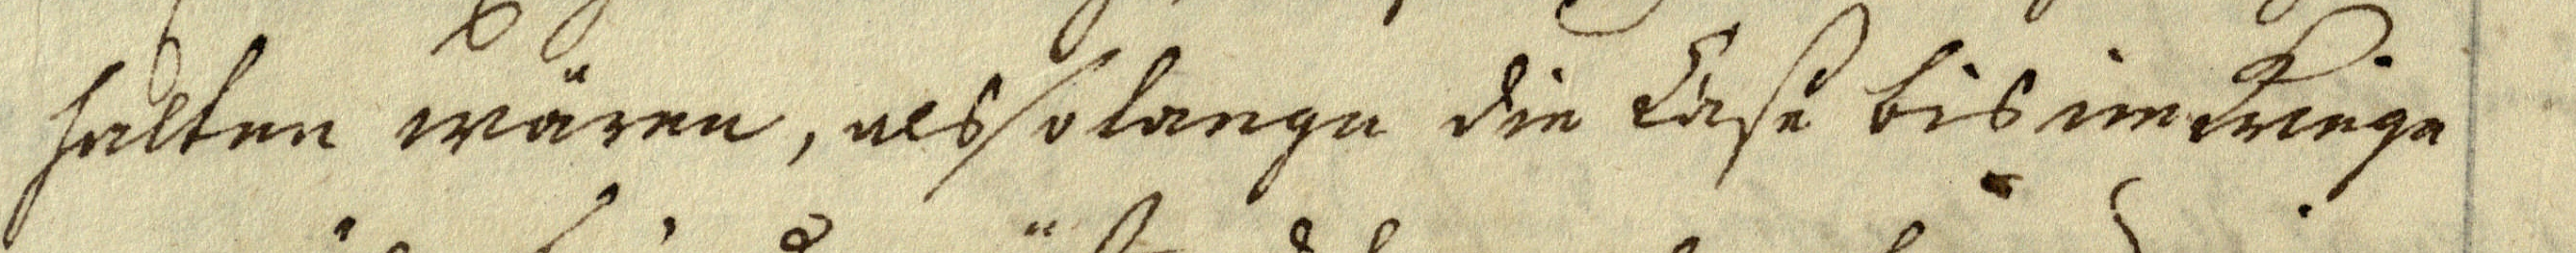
halten wären, als so lange die Caße bis im Kriege
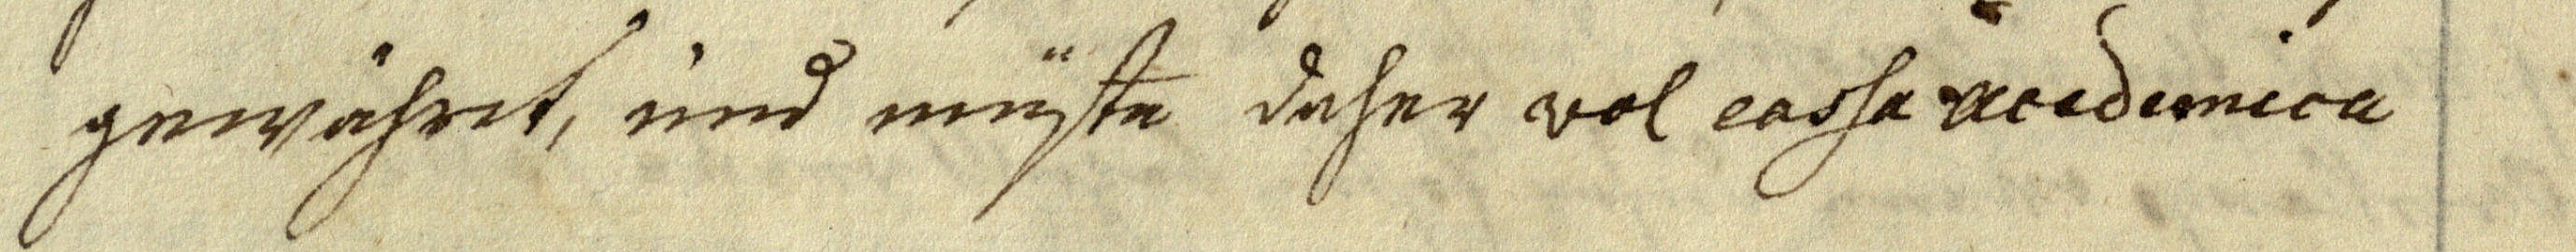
gewähret, und müste daher wol cassa academica
